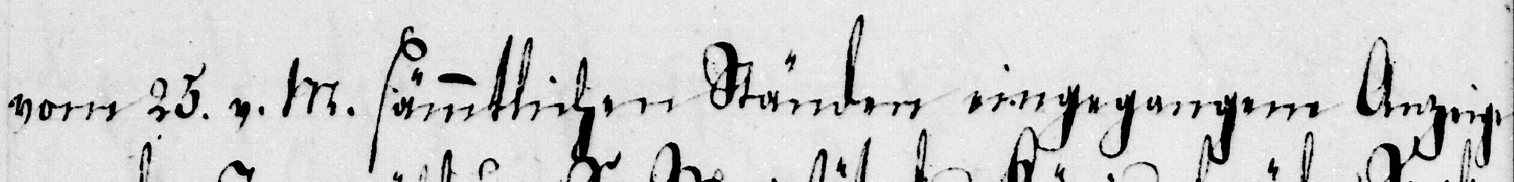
vom 25. v. M. sämmtlichen Ständen eingegangene Anzeige
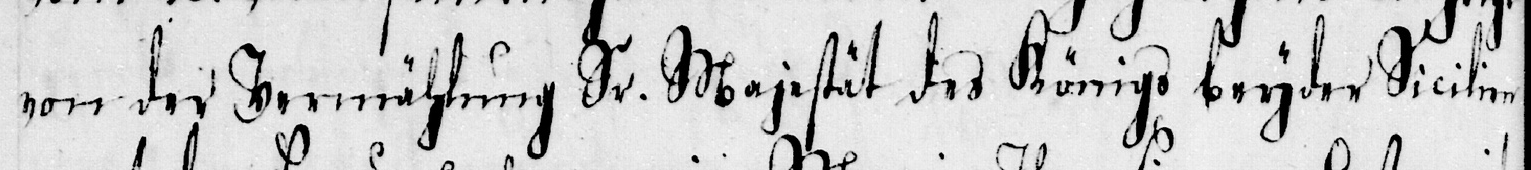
von der Vermählung Sr. Majestät des Königs beyder Sicilien
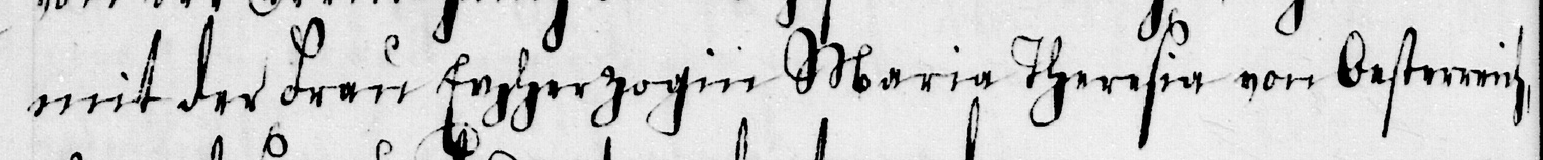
mit der Frau Erzherzogin Maria Theresia von Oesterreich
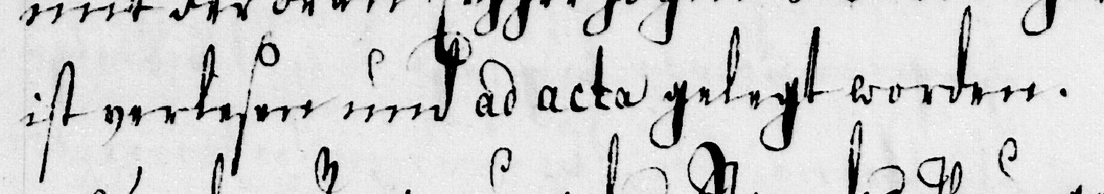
ist verlesen und ad acta gelegt worden.
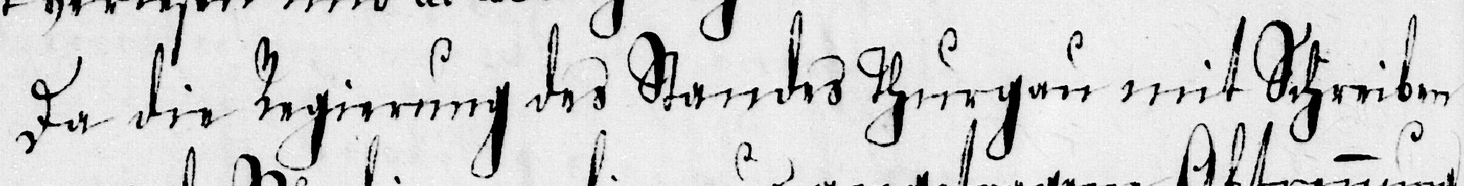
Da die Regierung des Standes Thurgau mit Schreiben
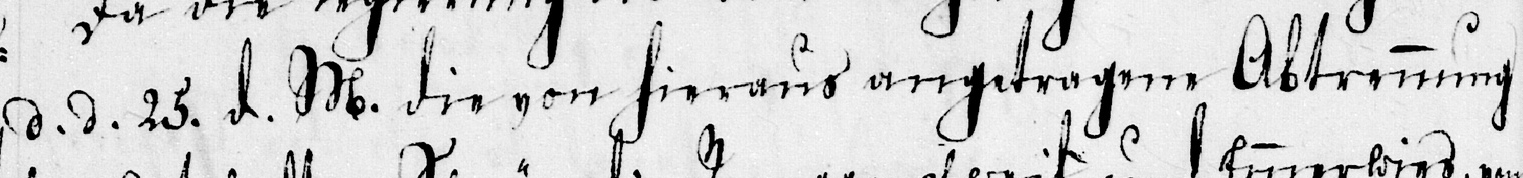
d.d. 25. d. M. die von hieraus angetragene Abtrennung
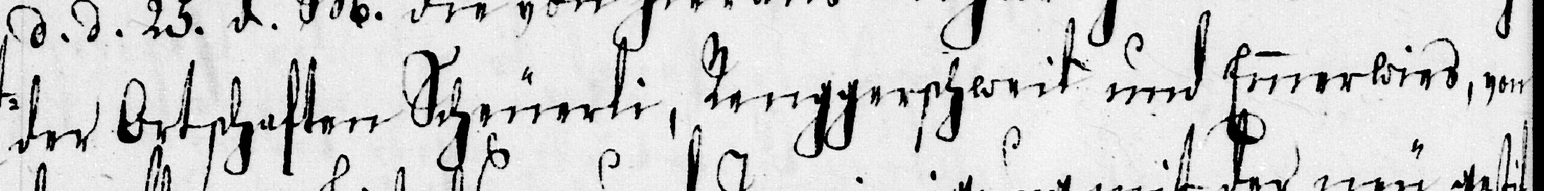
der Ortschaften Scheuerli, Renggerschweil und Emmerwies, von
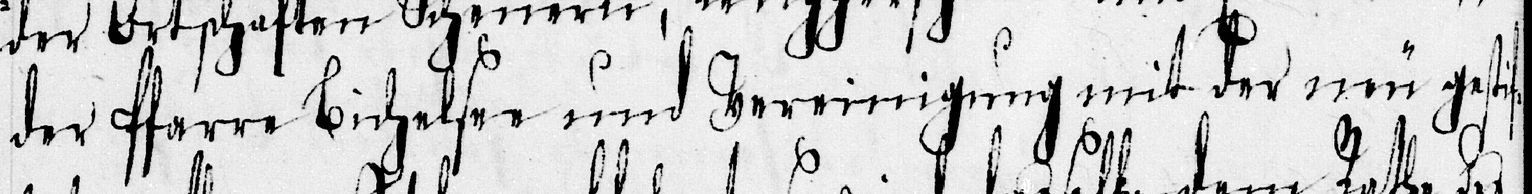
der Pfarre Bichelsen und Vereinigung mit der neu gest¬
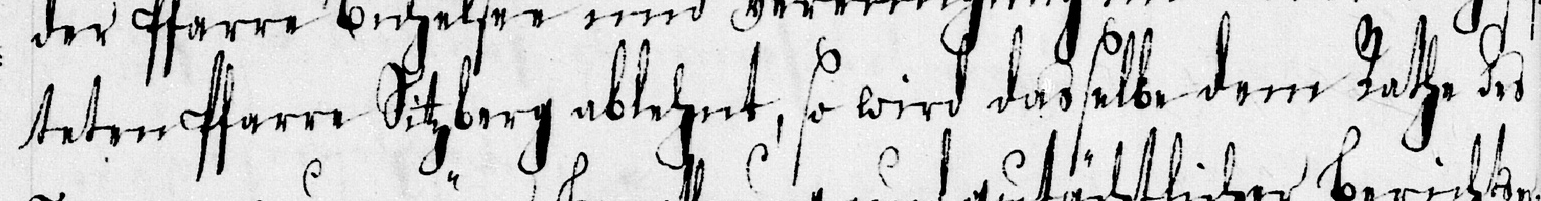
teten Pfarre Sitzberg ablehnt, so wird dasselbe dem Rathe des
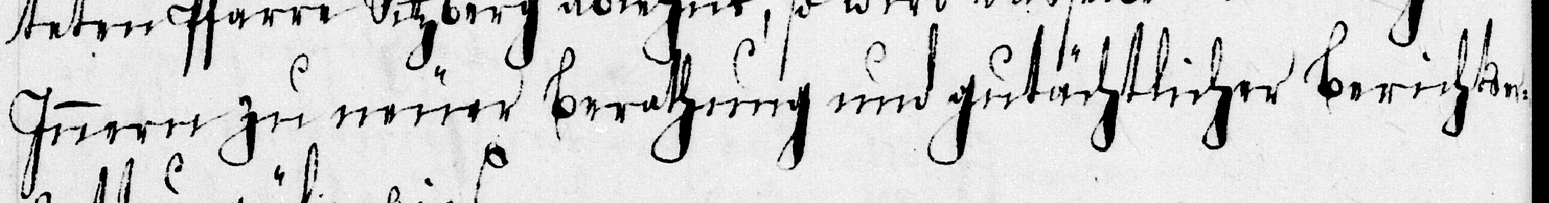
Innern zu neuer Berathung und gutächtlicher Berichter¬
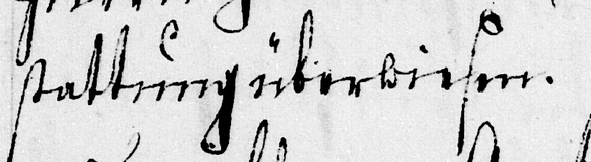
stattung überwiesen.
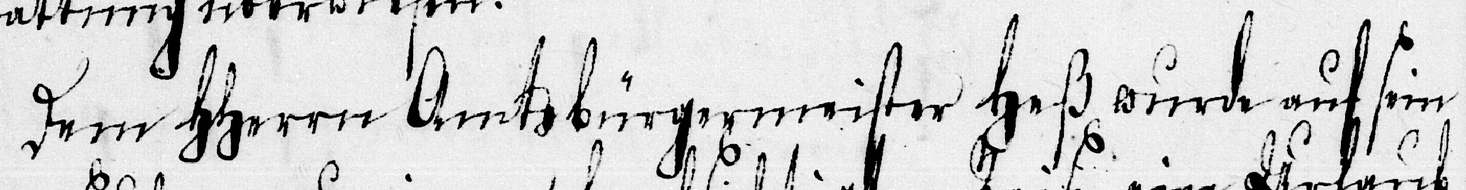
Dem HHerrn Amtsbürgermeister Heß wurde auf sein
